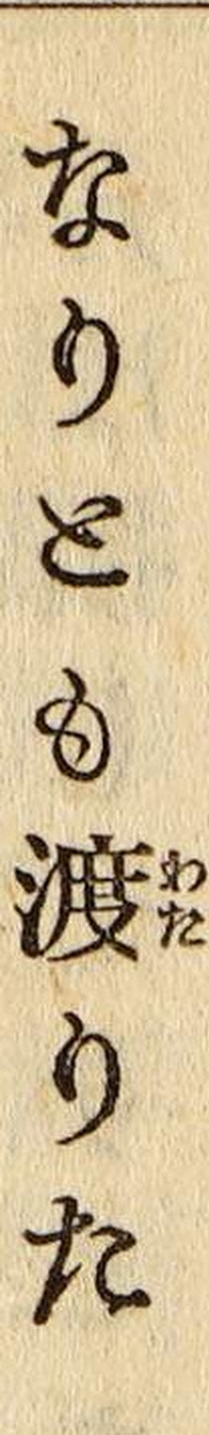なりとも渡りた
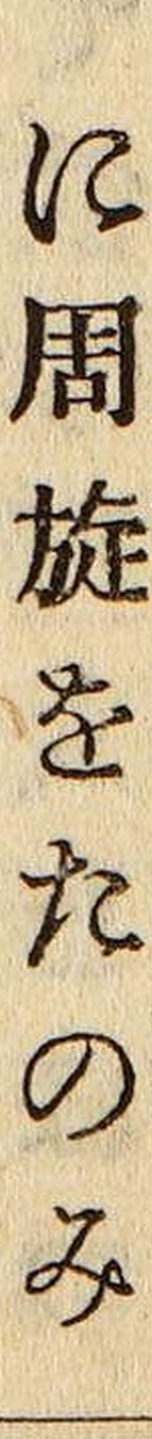に周旋をたのみ
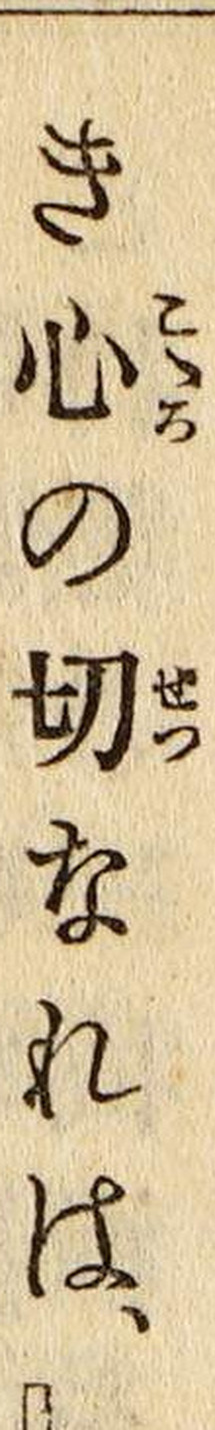き心の切なれは、
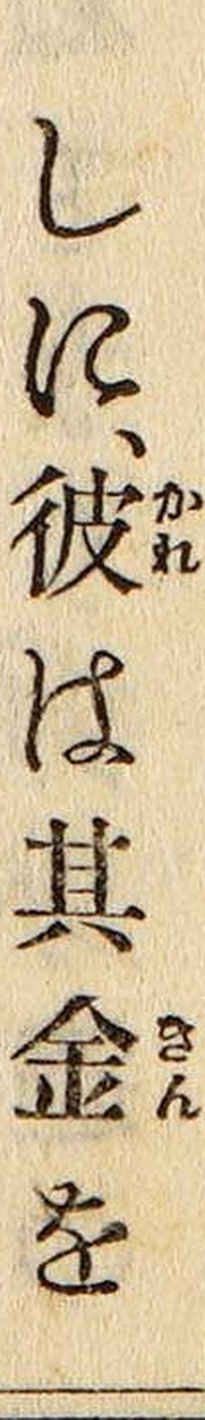しに、彼は其金を
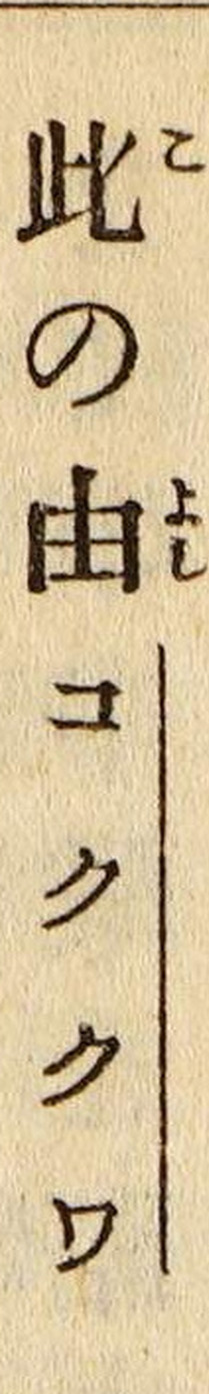此の由コククワ
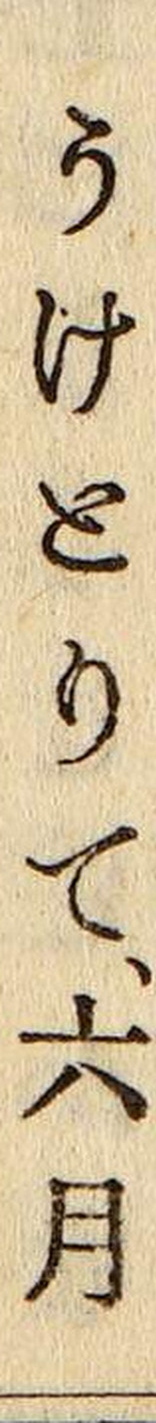うけとりて、六月
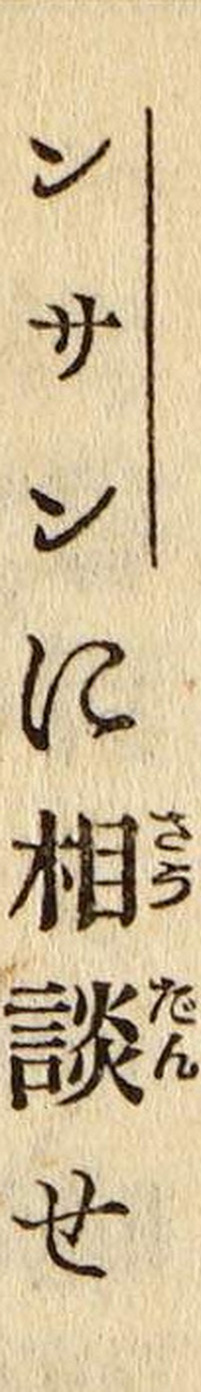ンサンに相談せ
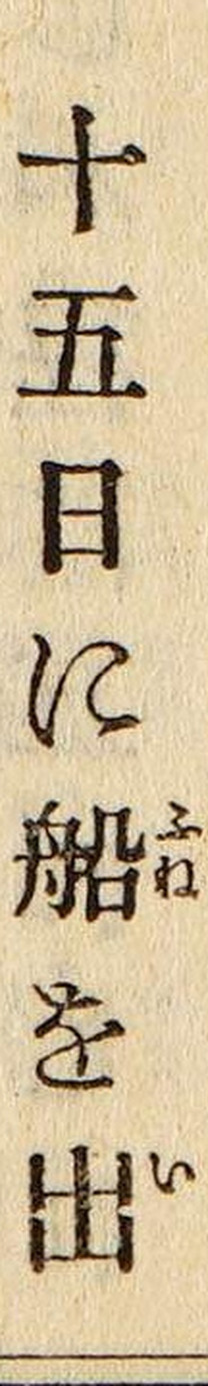十五日に船を出
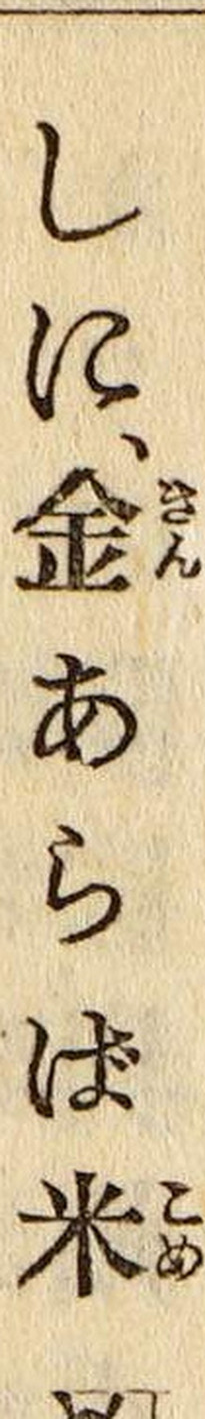しに、金あらば米
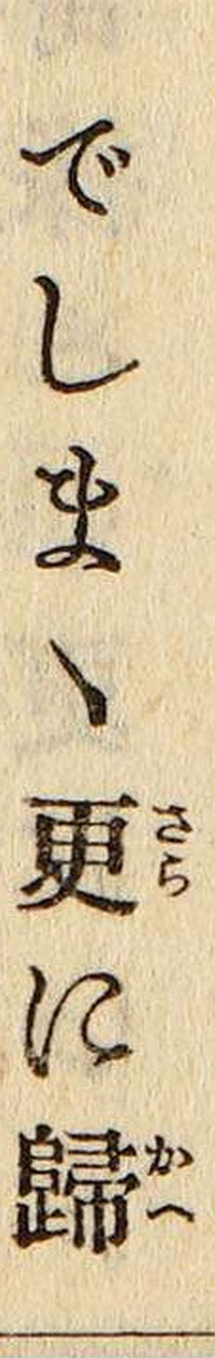でしまヽ更に帰
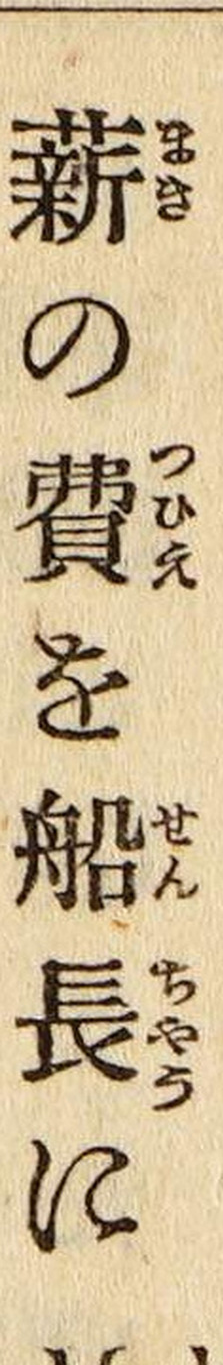薪の費を船長に
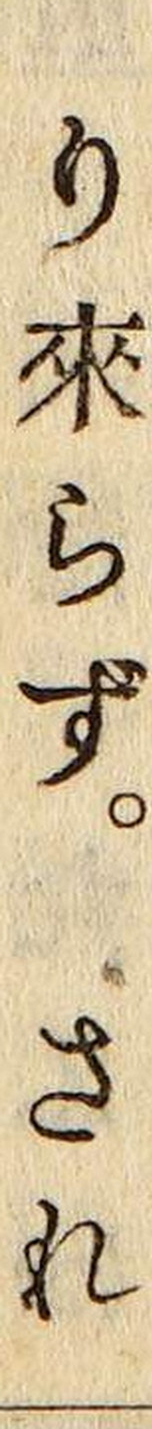り来らず。され
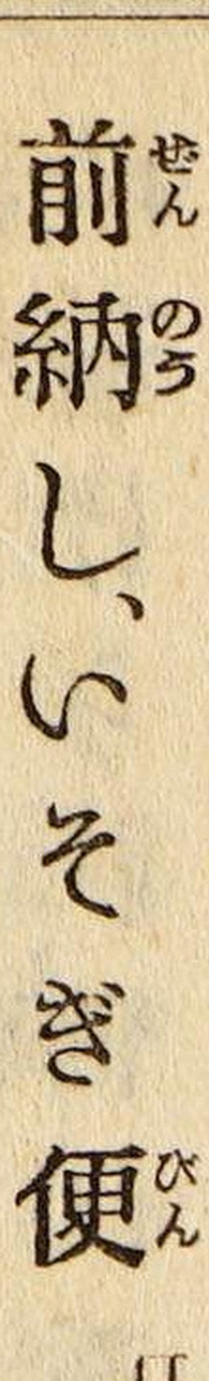前納し、いそぎ便
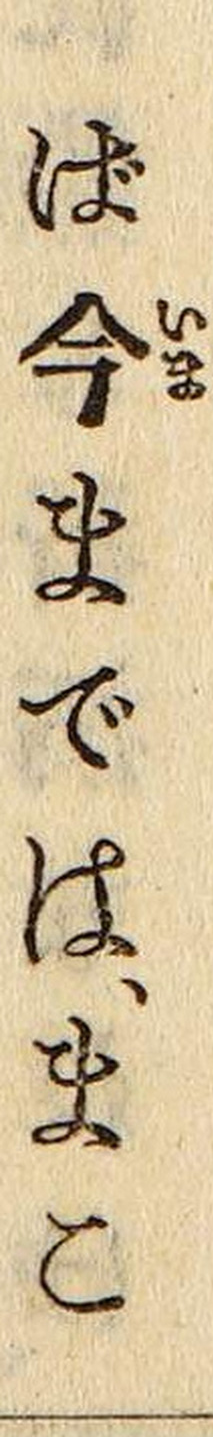ば今までは、まこ
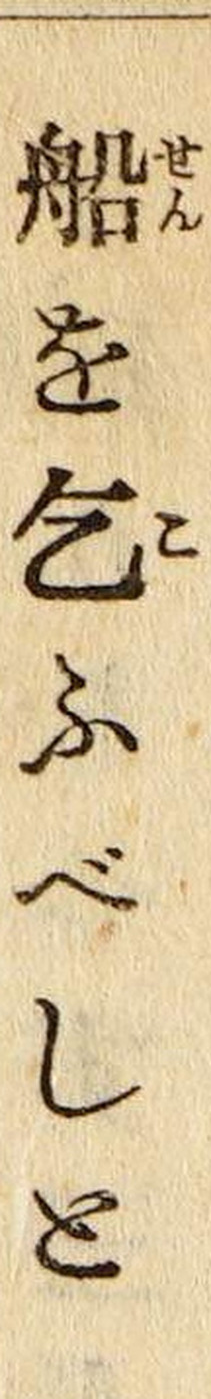船を乞ふべしと
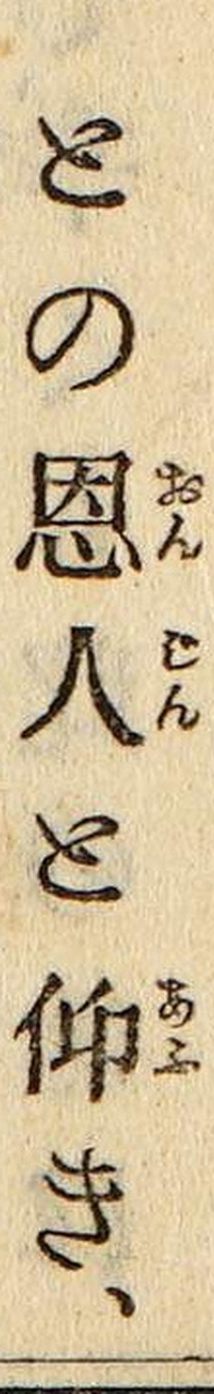との恩人と仰き、
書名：日本漂流譚
